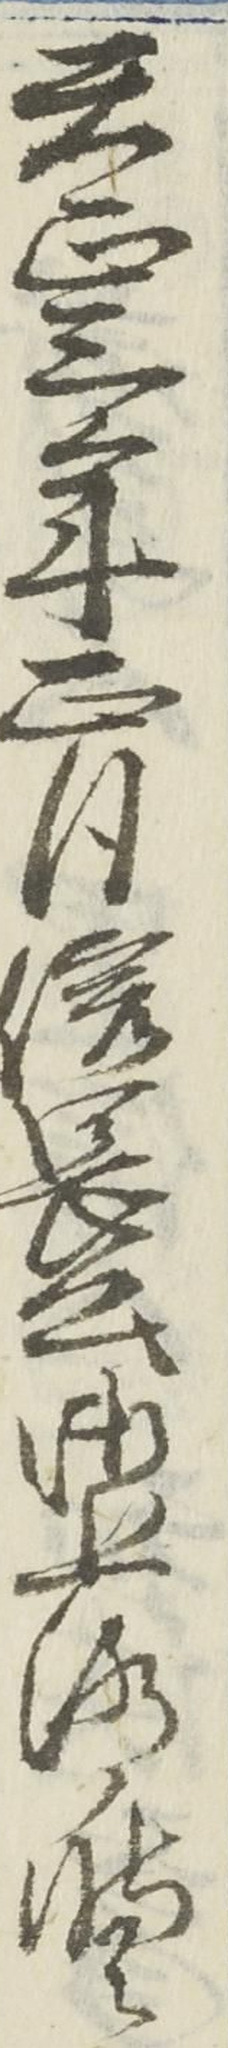天正三年正月信長公御上落ノ時ニ
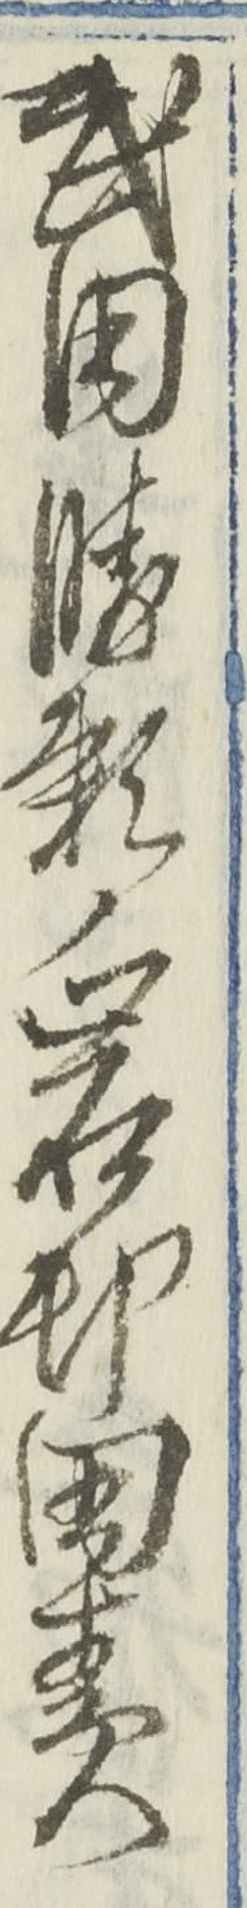武田勝頼ノ岩邨田責
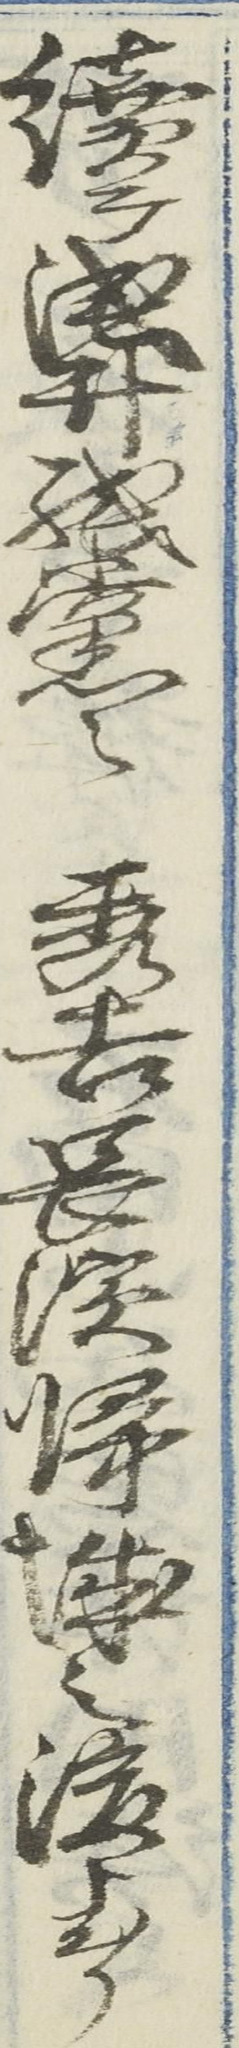続テ浅井残党之秀吉長浜帰城之渡ト云う
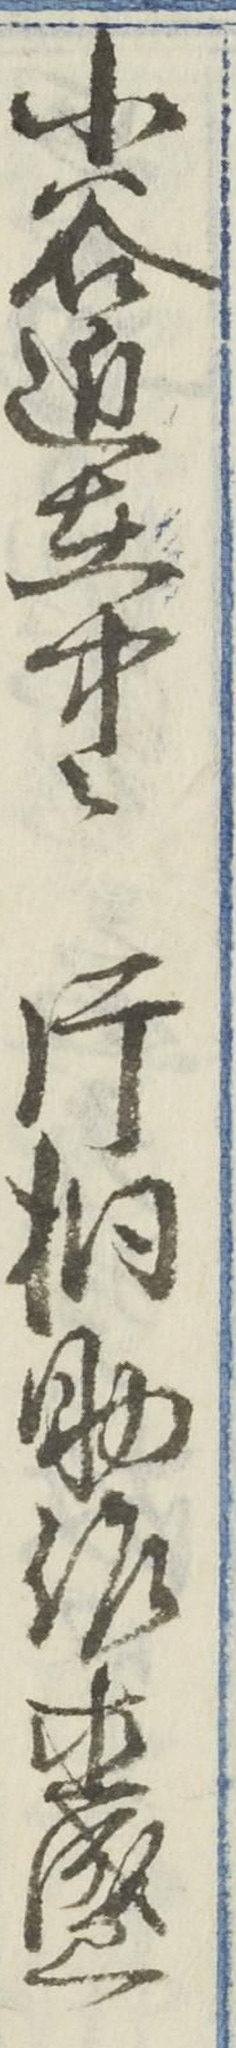小谷近在中之片桐助作直盛
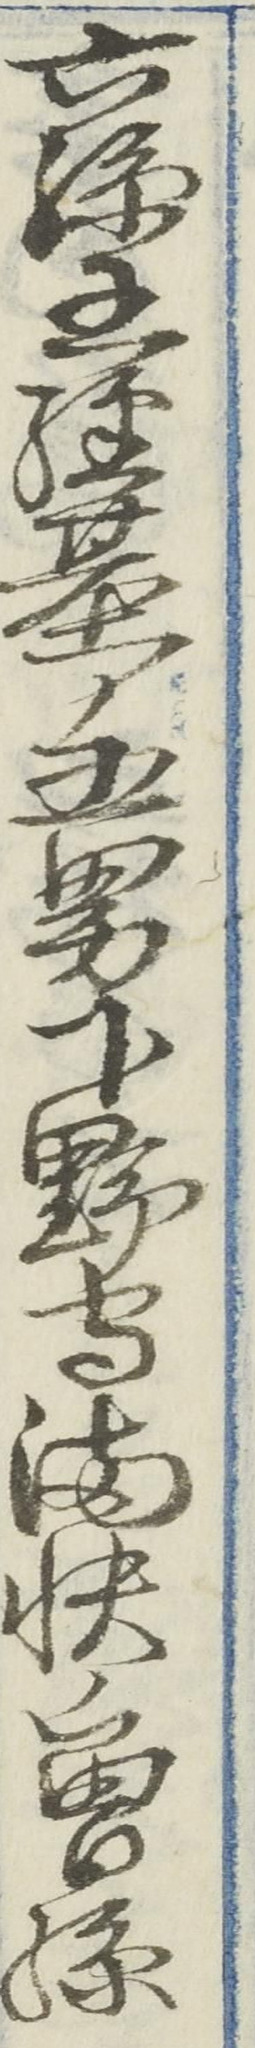六孫王経基ノ五男下野守満快ノ曽孫
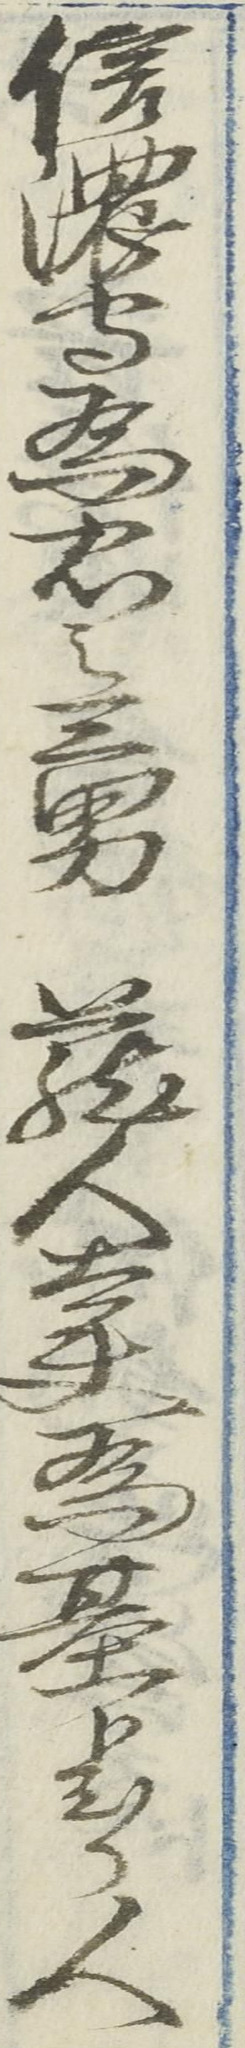信濃守為忠之三男蔵人太夫為基ト云う人
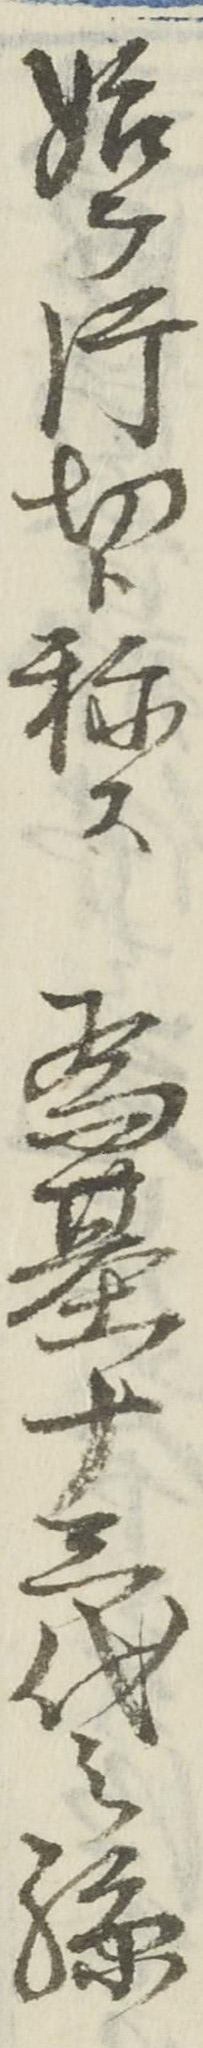始テ片切ト称ス為基十三代之孫
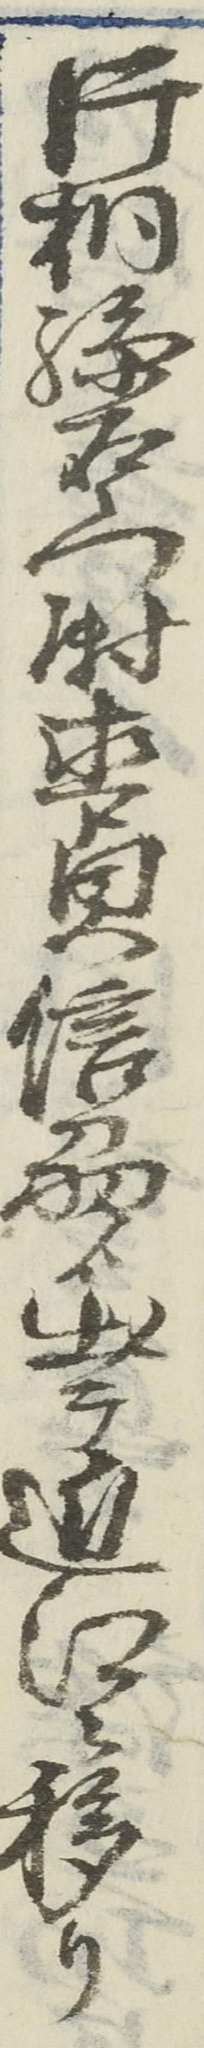片桐孫右衛門尉直貞信州ゟ出テ近江ニ移り
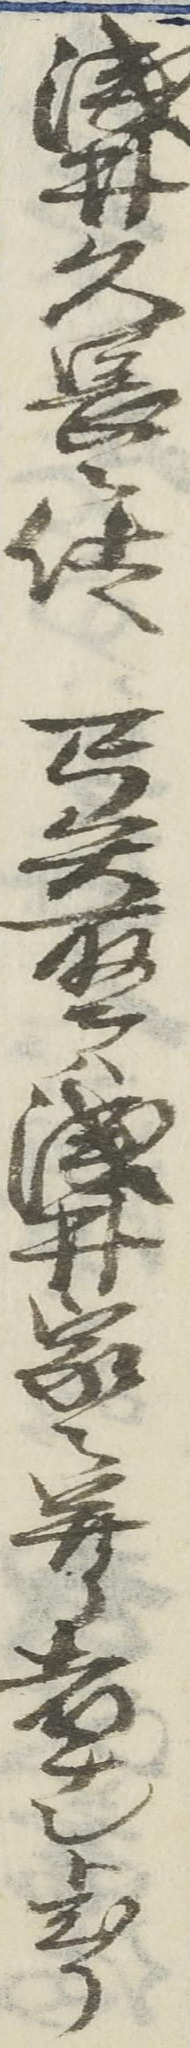浅井久長ニ仕へ弓矢取テハ浅井家ニ并者ナシト云う
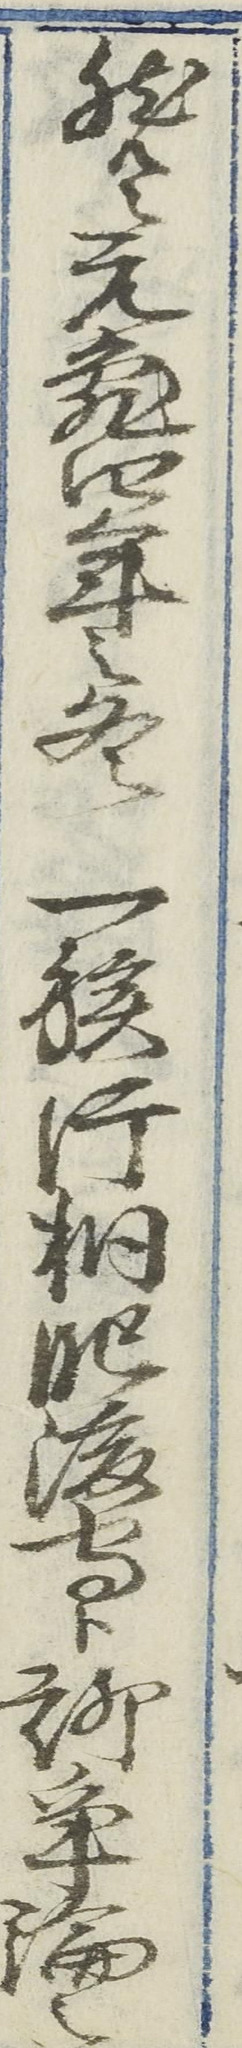然ルニ元亀四年之冬一族片桐肥後守ト聊か争論之
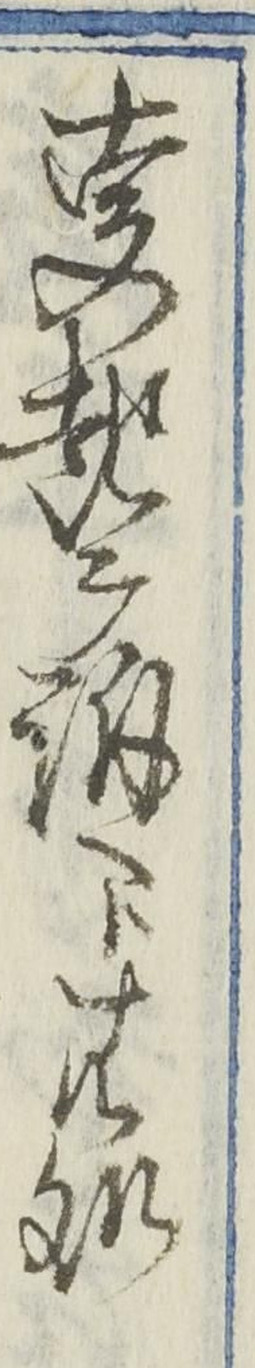事起テ訴へトナル処
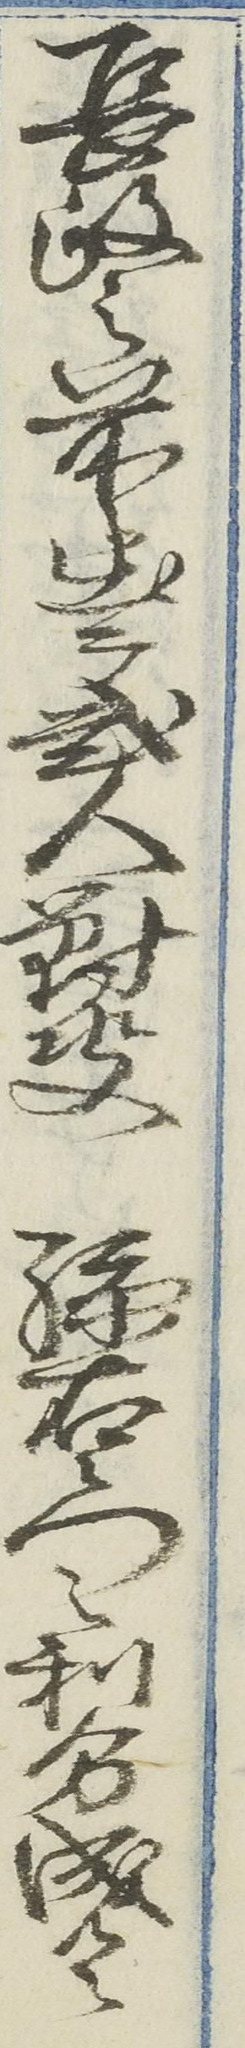長改之前書ヲ弐人対決孫右衛門之利分成ニ
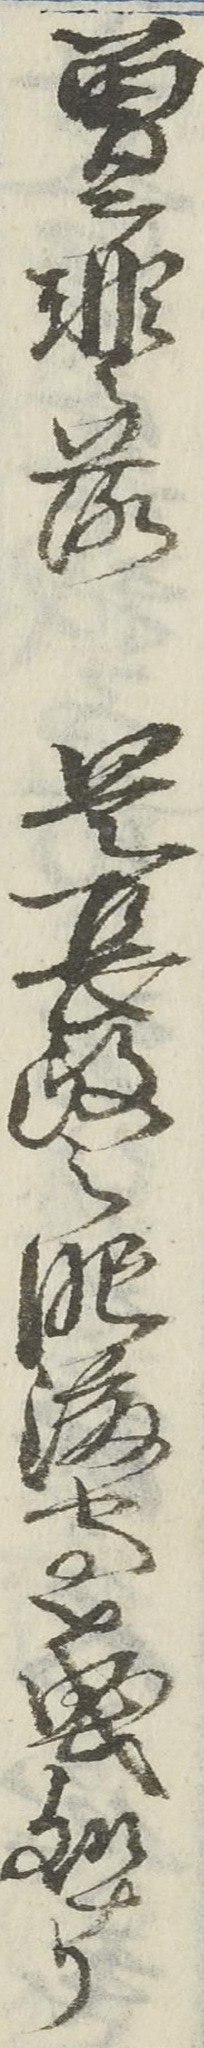曽テ非落是長政之肥後守を曳処ナリ
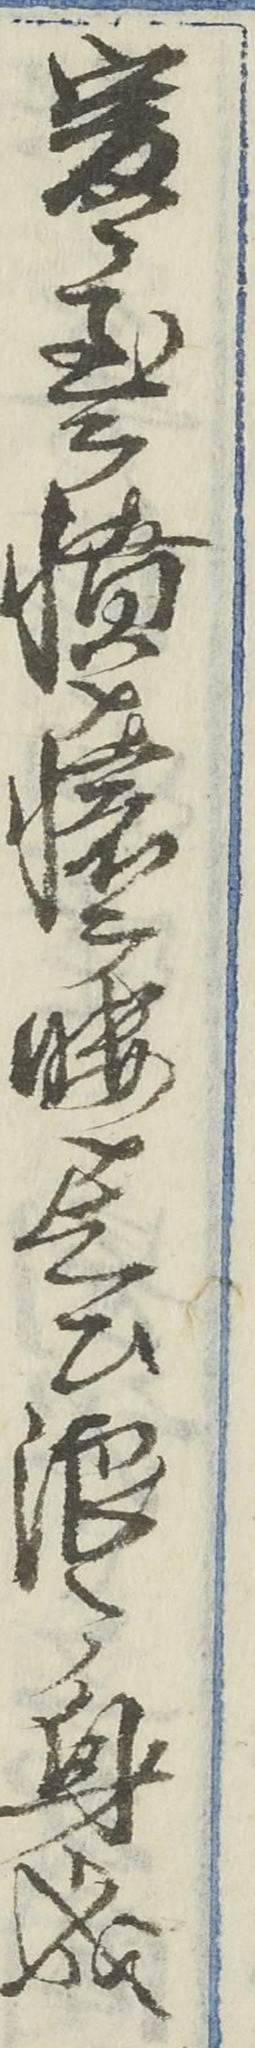寔ニ至テ憤ヲ懐テ暇ヲ乞ひ浪々ノ身ト成
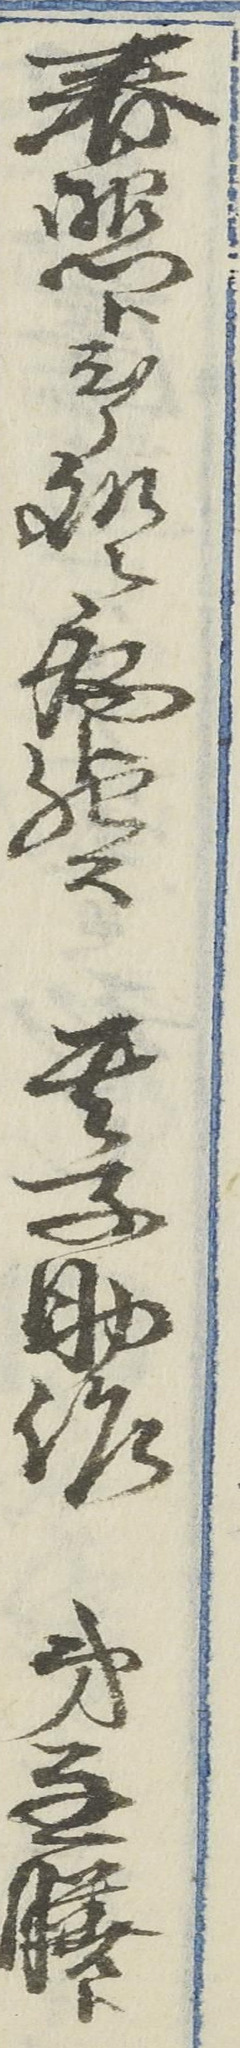春照ト云う処て病死ス其子助作弟主膳ト
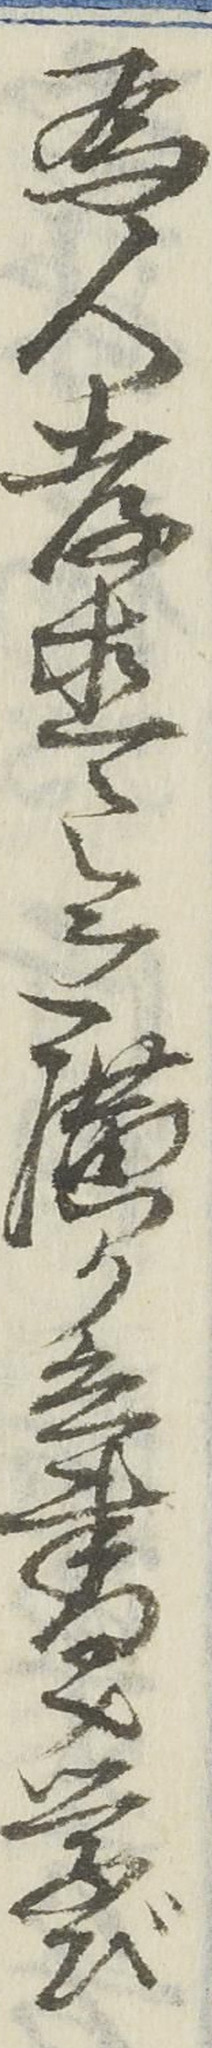為人孝直ニシテ広ク兵書ヲ学び
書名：伏水大地震
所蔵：東京大学地震研究所図書室 Earthquake Research Institute Library, The University of Tokyo, JAPAN
